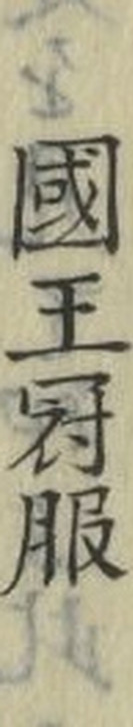国王冠服
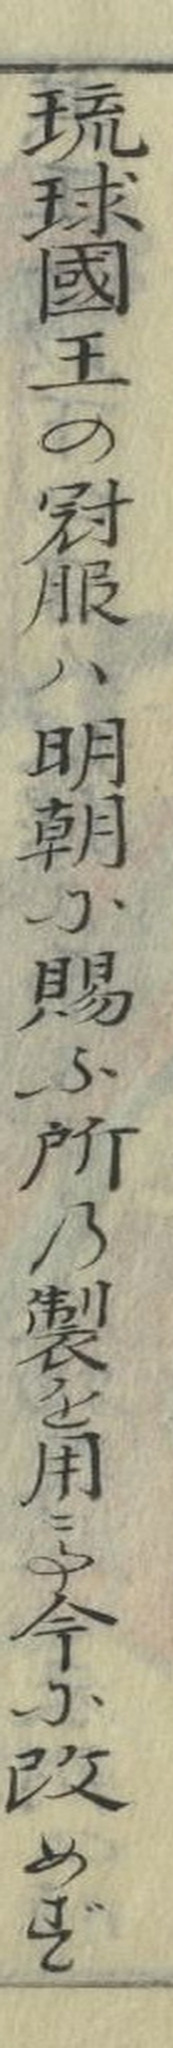琉球国王の冠服は明朝に賜ふ所の製を用て今に改めず
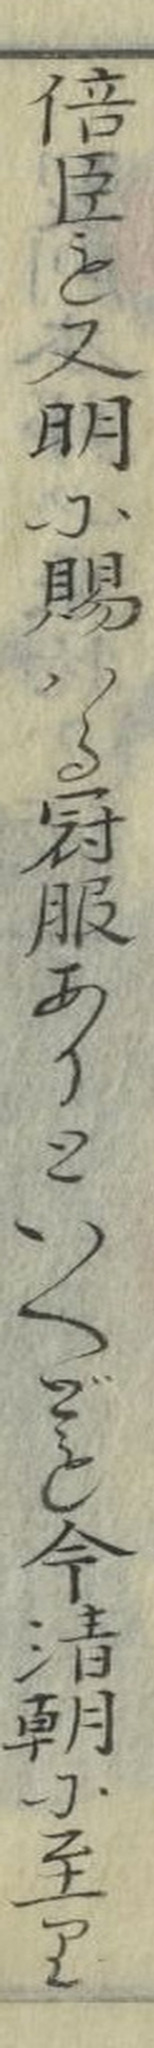倍臣も又明に賜はる冠服ありといへども今清朝に至り
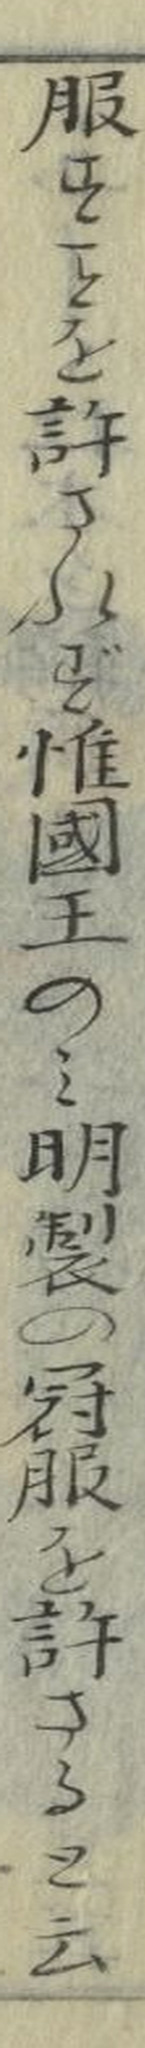服すことを許されず惟国王のみ明製の冠服を許さると云
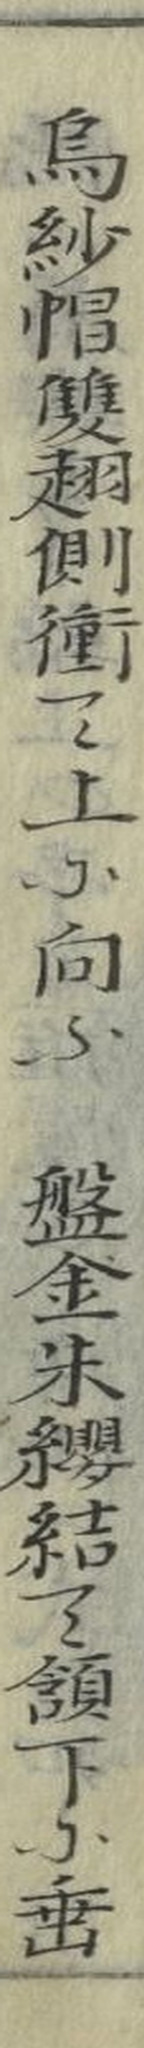烏紗帽双趐側衝て上に向ふ盤金朱纓結て頷下に垂
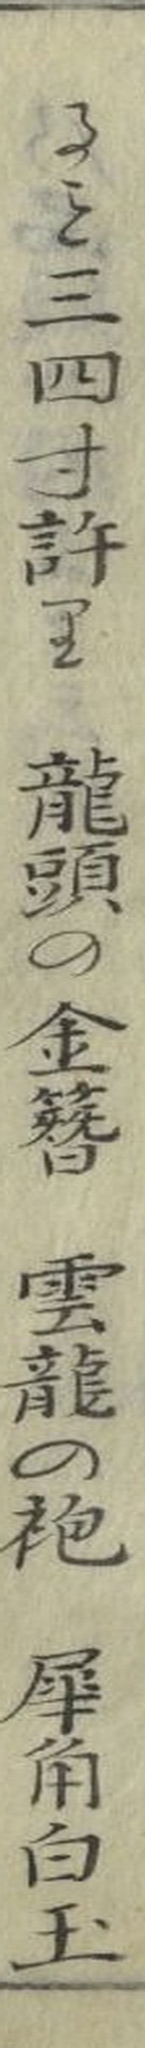ること三四寸許り龍頭の金簪雲龍の袍犀角白玉
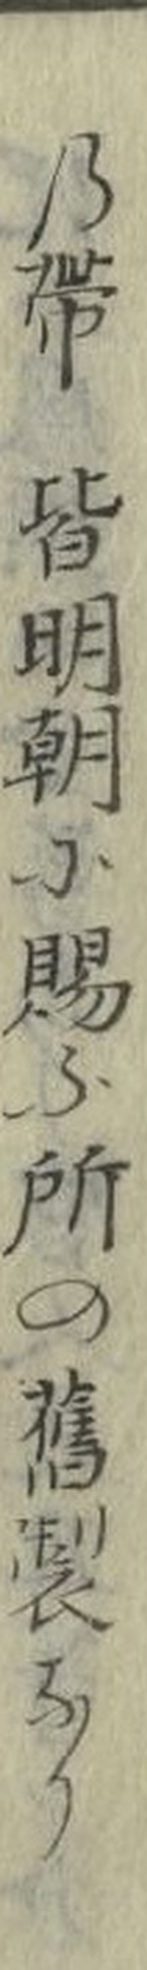の帯皆明朝に賜ふ所の旧製なり

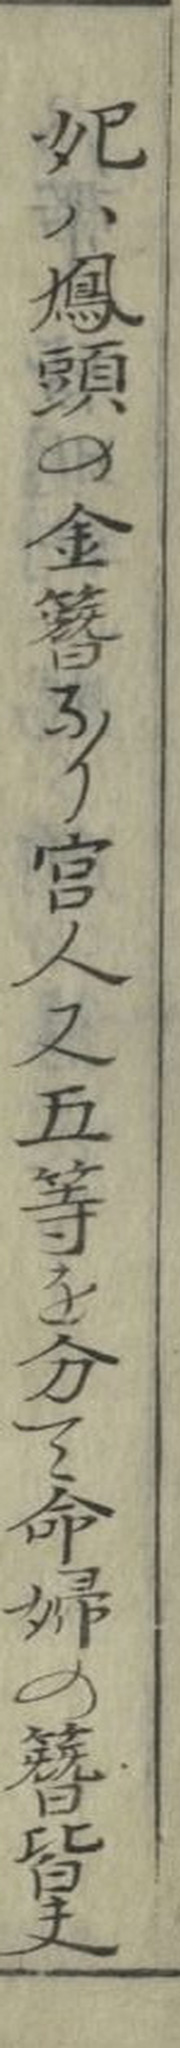妃は鳳頭の金簪なり官人又五等を分て命婦の簪皆夫
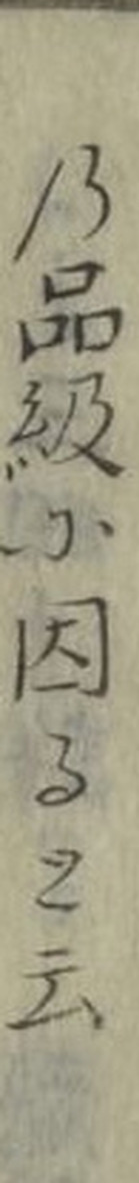の品級に因ると云
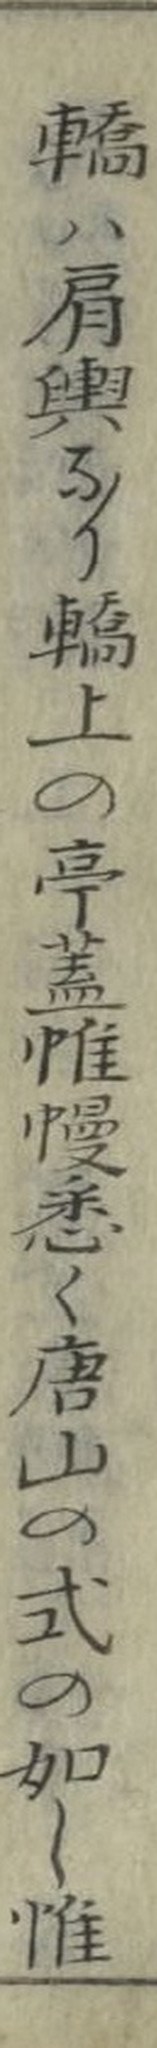轎は肩輿なり轎上の亭蓋帷幔悉く唐山の式の如し惟
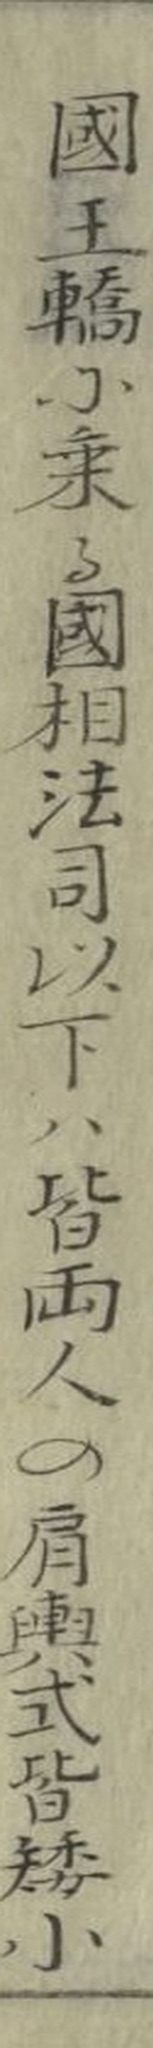国王轎に乗る国相法司以下は皆両人の肩輿式皆矮小
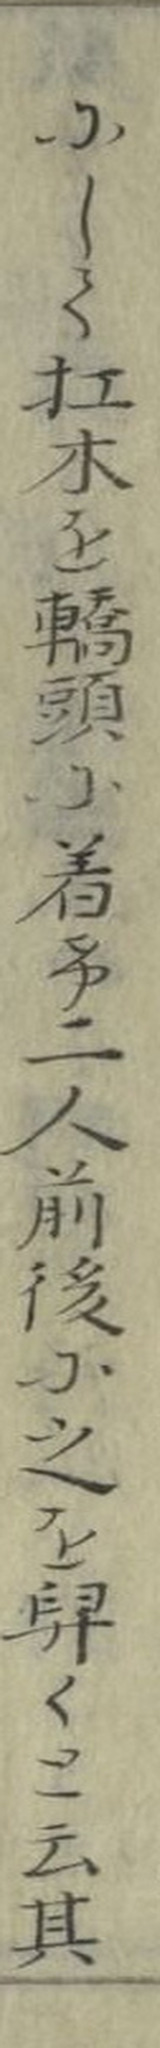にして扛木を轎頭に着け二人前後に之を舁くと云其
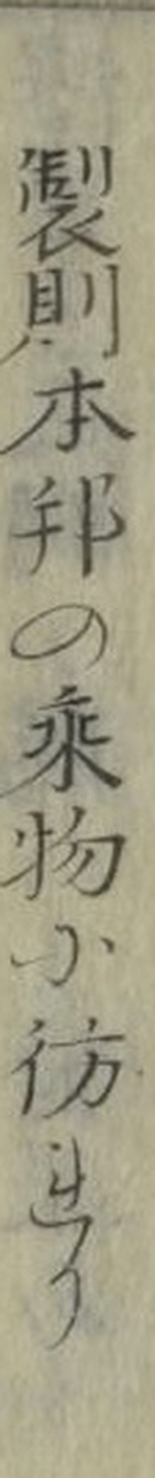製則本邦の乗物に彷れり
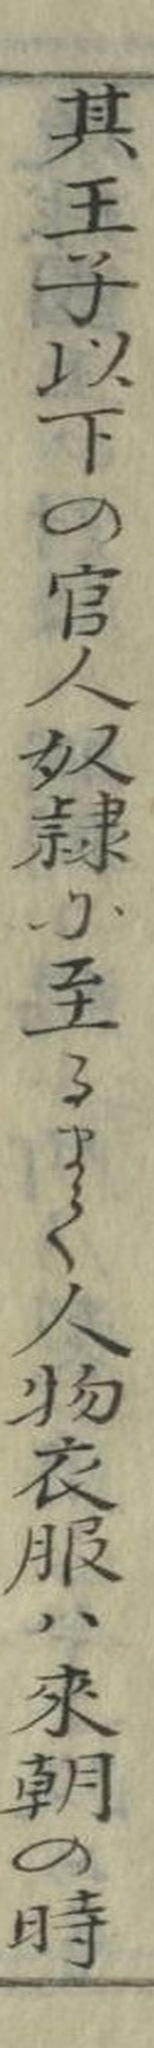其王子以下の官人奴隷に至るまて人物衣服は来朝の時
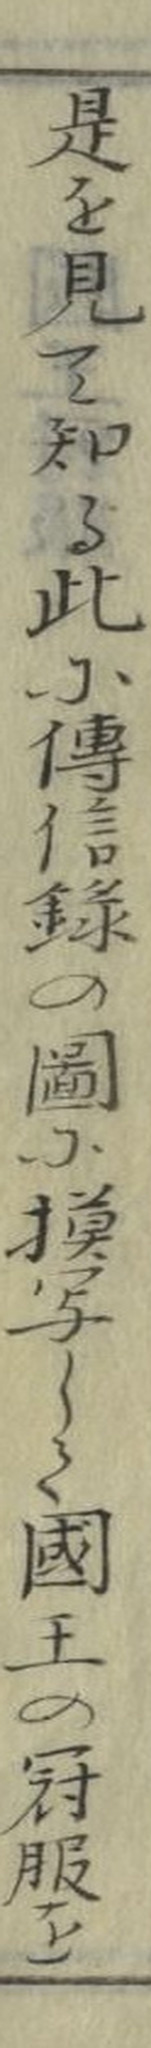是を見て知る此に伝信録の図に摸写して国王の冠服を
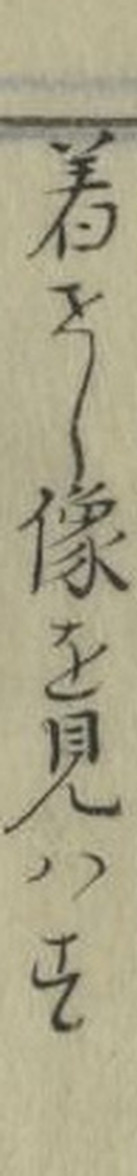着せし像を見はす
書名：琉球沿革志 下
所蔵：University of the Ryukyus Library
